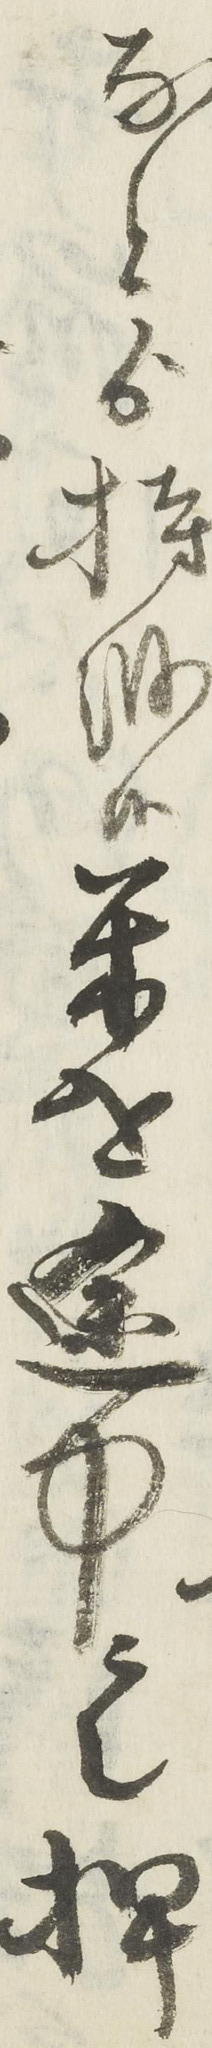なとゟ持越候米を途中ニて押
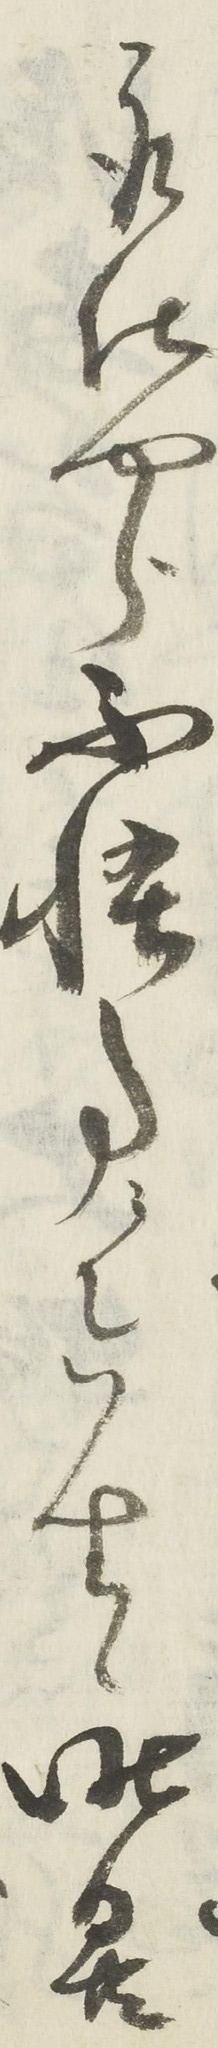取仕やら不軽事ニて御坐候昨日共
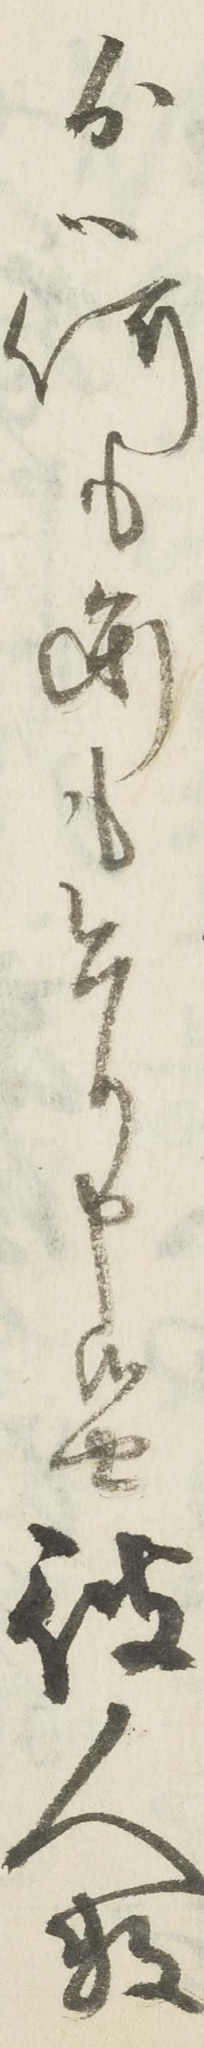ゟは何も角もとり申候由彼人数
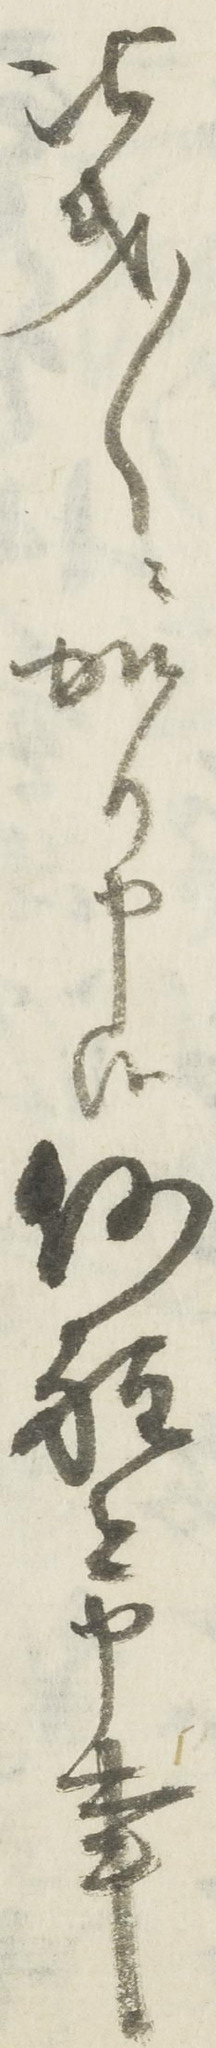次第〳〵ニ加り申候何程と申事
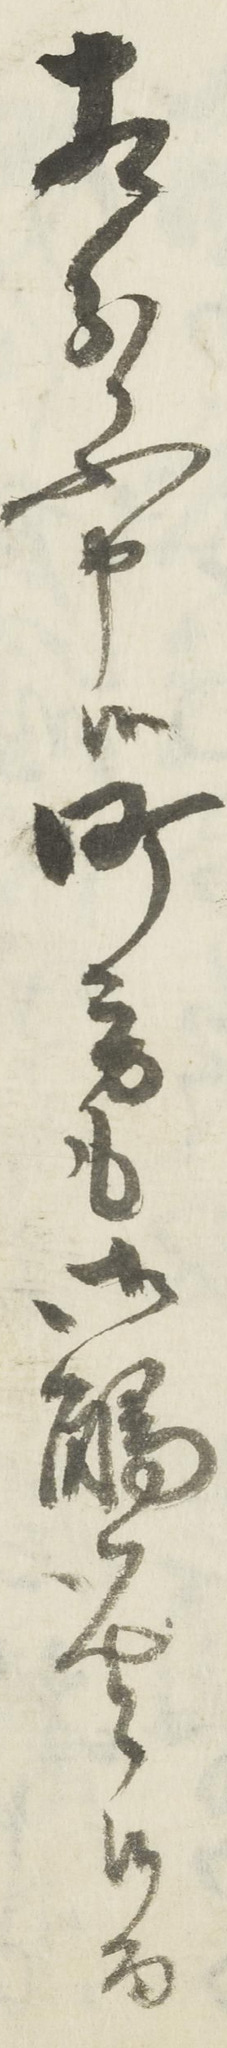相分り不申候町方も御触御坐候而
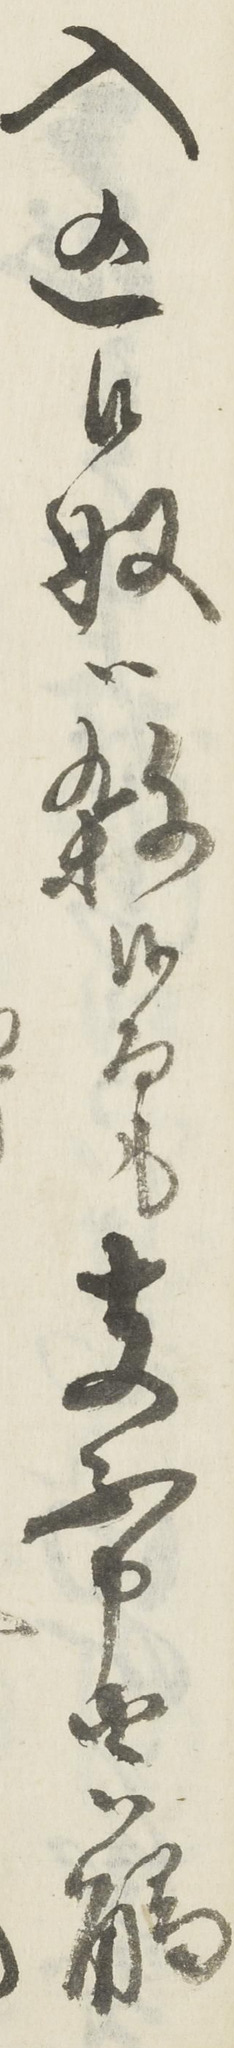入込候奴は殺候而も支不申由御触
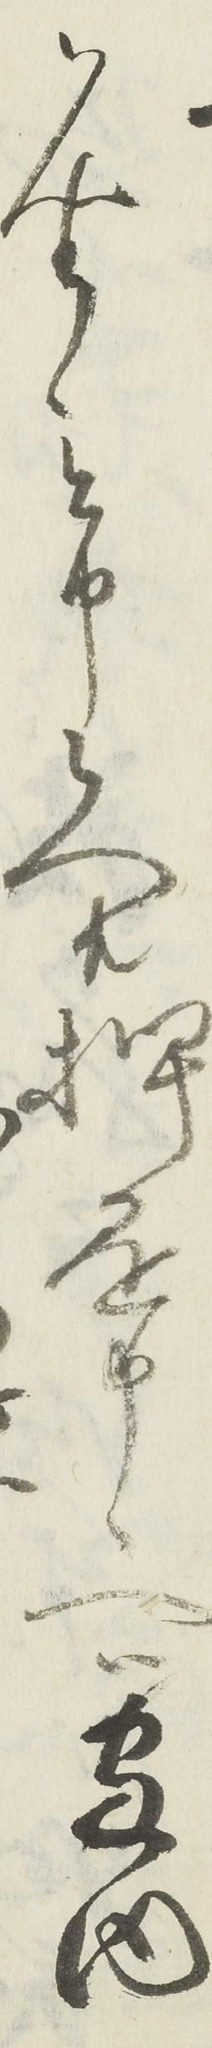御坐候と申候へ共押懸申候へは家内
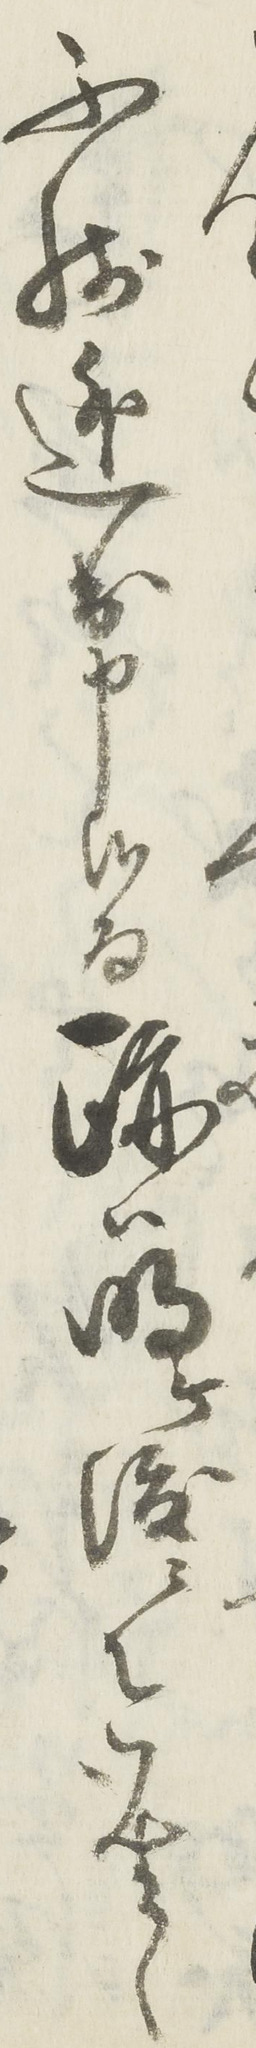不残逃出申候而跡は明ケ渡ニて御坐候
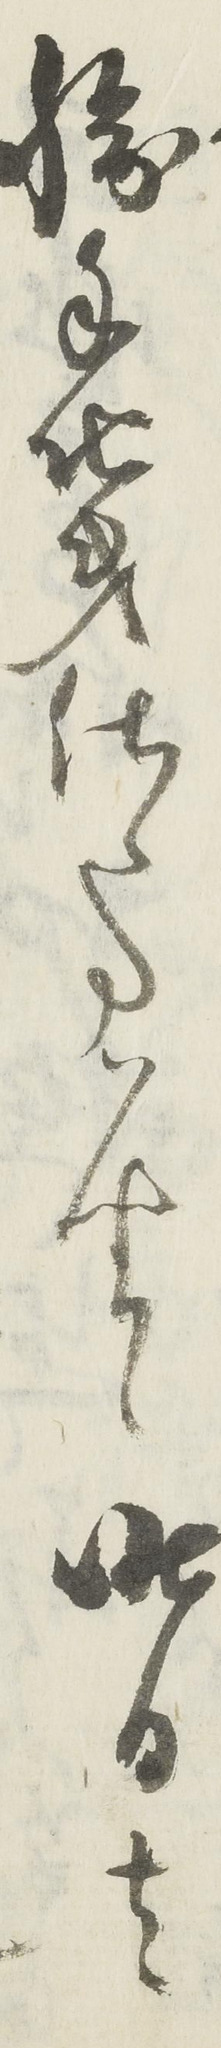勝手次第仕候事御坐候昨日は
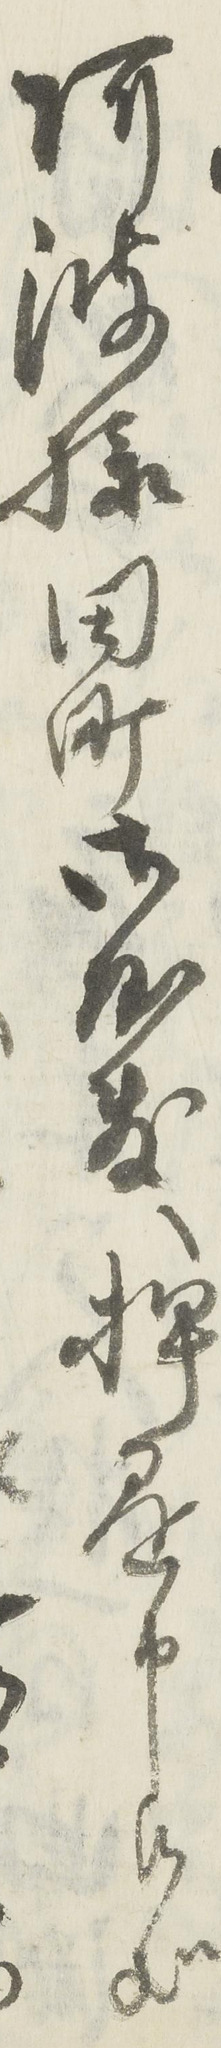阿波様田町御屋敷へ押懸申候処
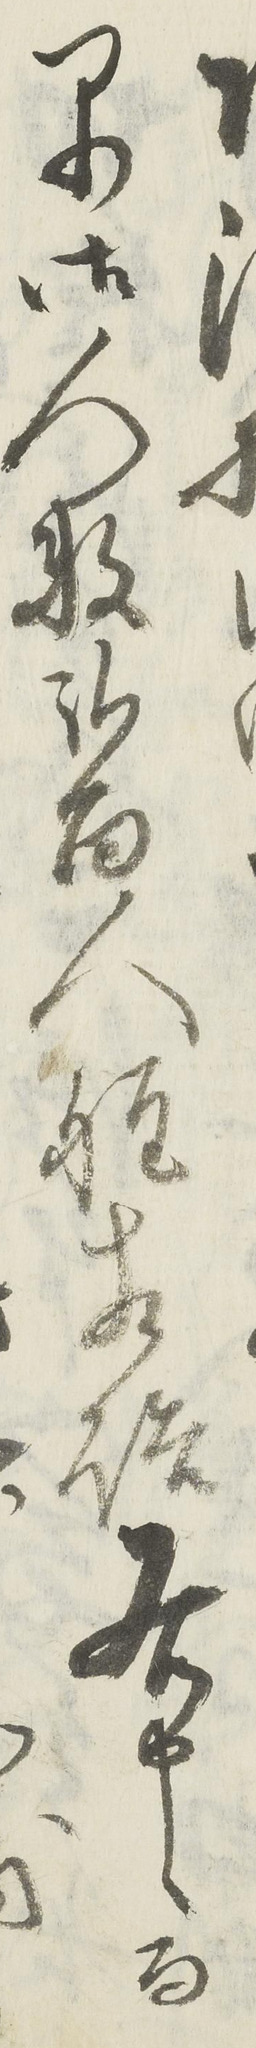早御人数弐百人程相詰居申候而
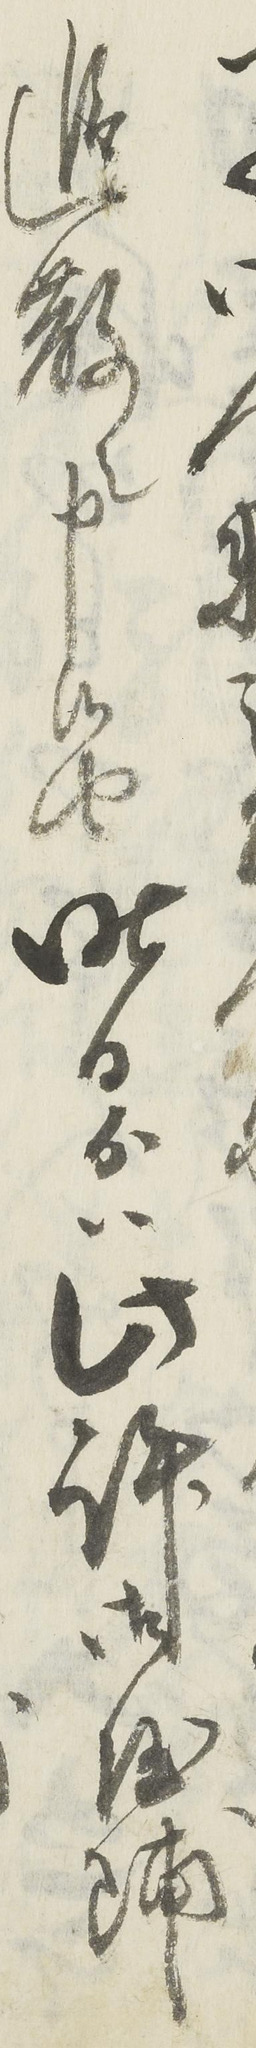退散シ申候由昨日ゟは此許御屋鋪
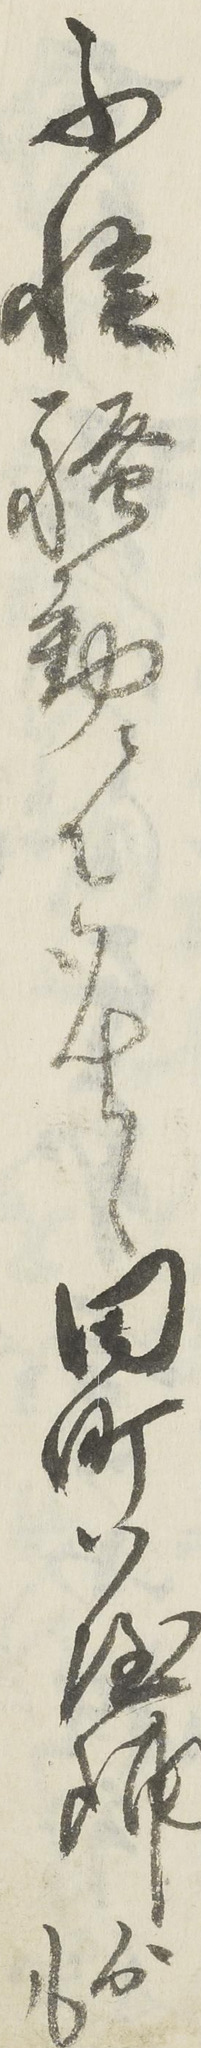不軽騒動二て御坐候田町御屋鋪ゟも
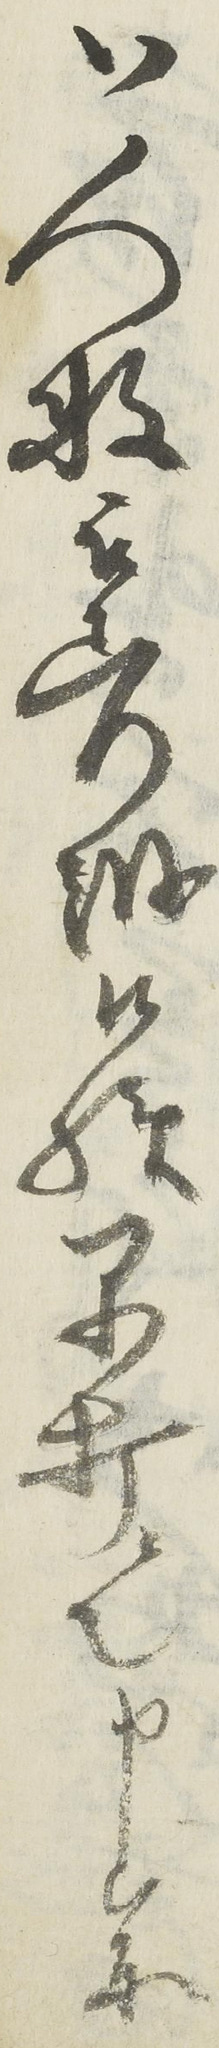御人数被差越候様早打ニて申参

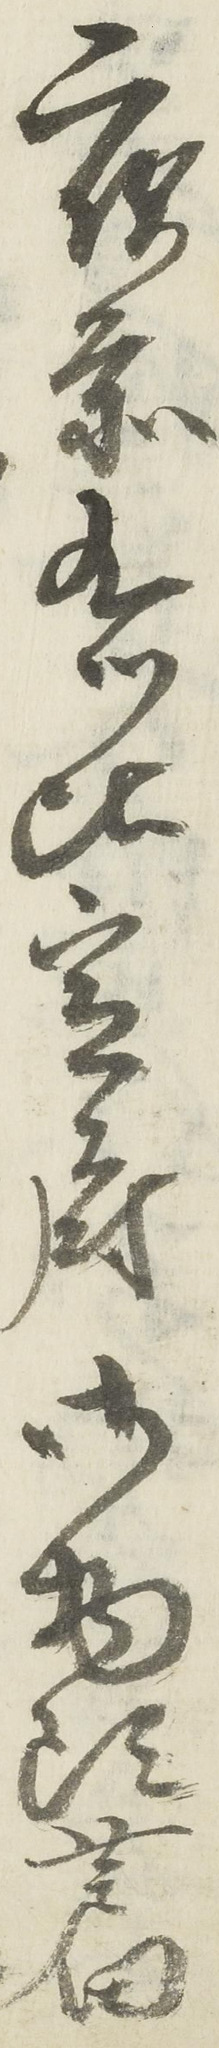夜前九つ比定尉御物頭芦田
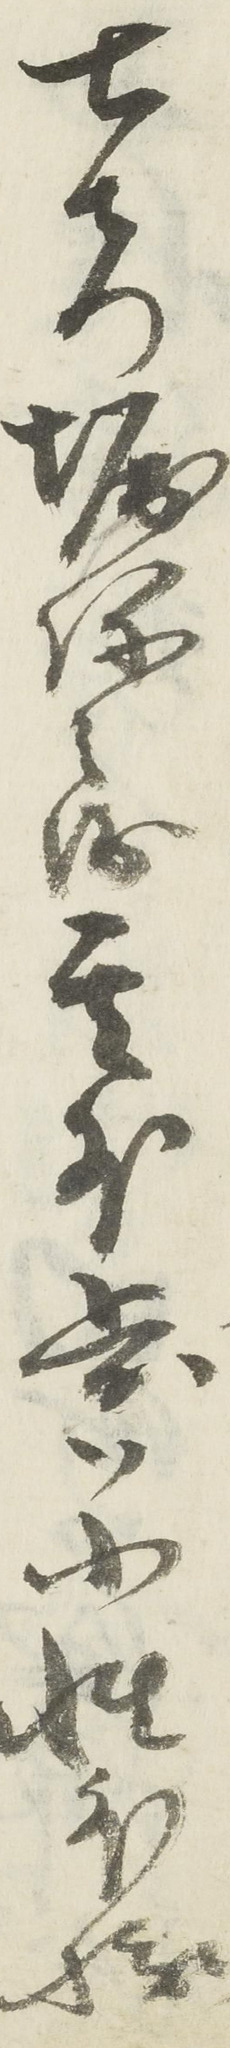七右衛門堀弥兵衛其外歩御小性外様
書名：後見笑
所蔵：東京大学地震研究所図書室 Earthquake Research Institute Library, The University of Tokyo, JAPAN
